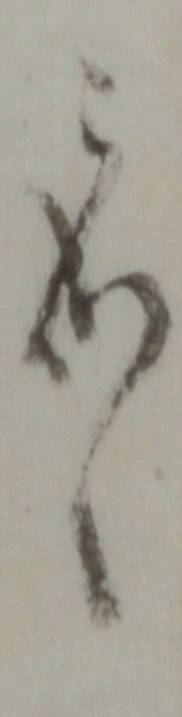被成候
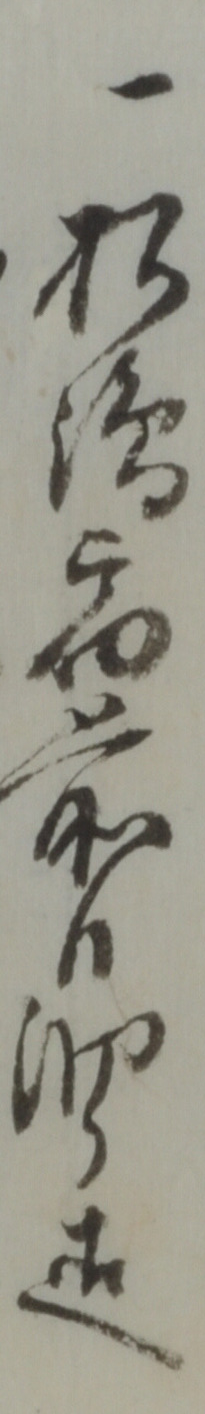一松嶋宿前日泊り迄
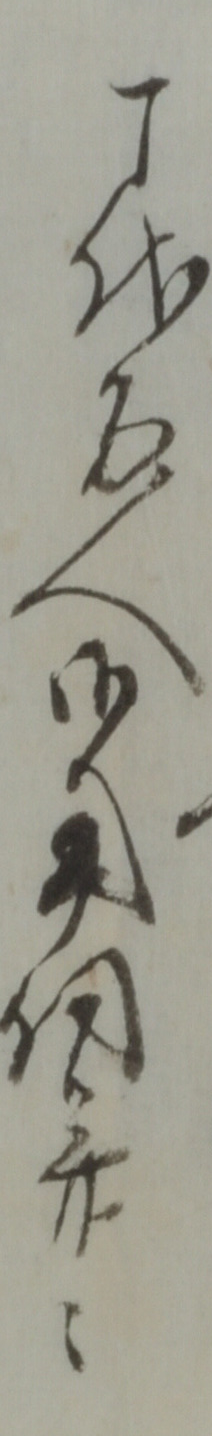丁代両人御用伺候并ニ
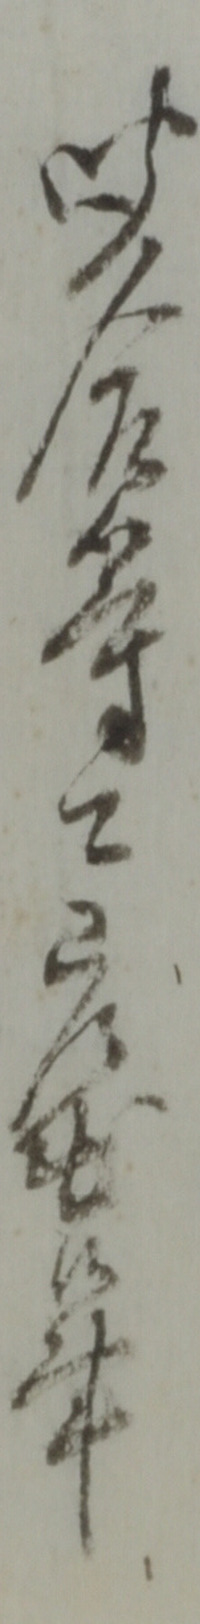聞合等可差出候事
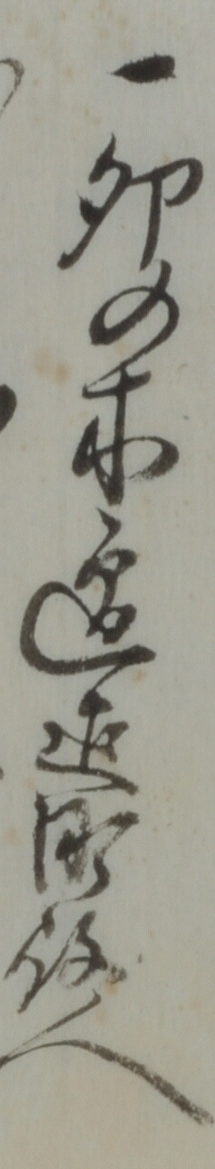一卯の木辺迄町役人
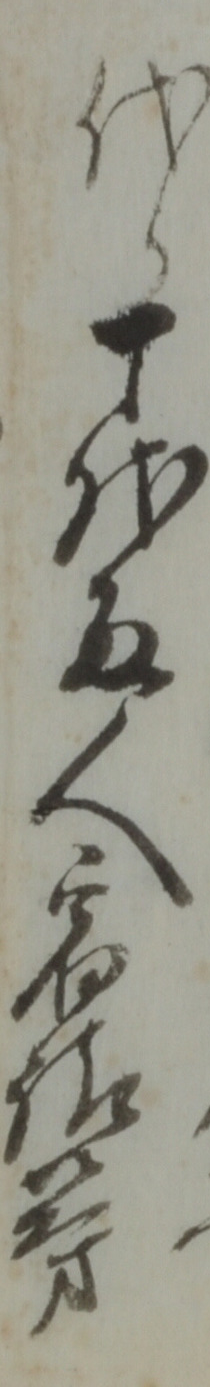代り丁代両人宿請等
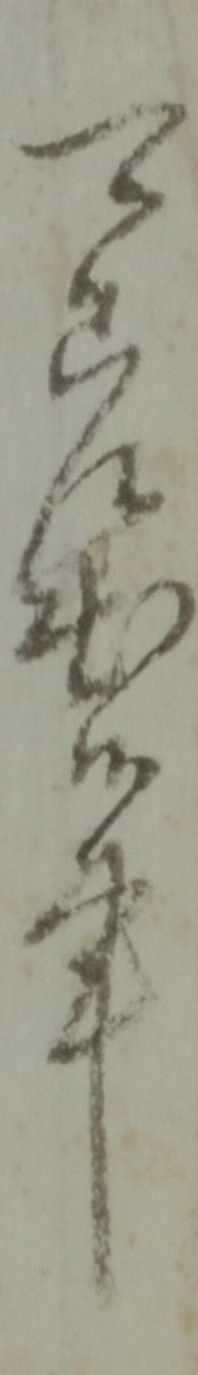可差出候事
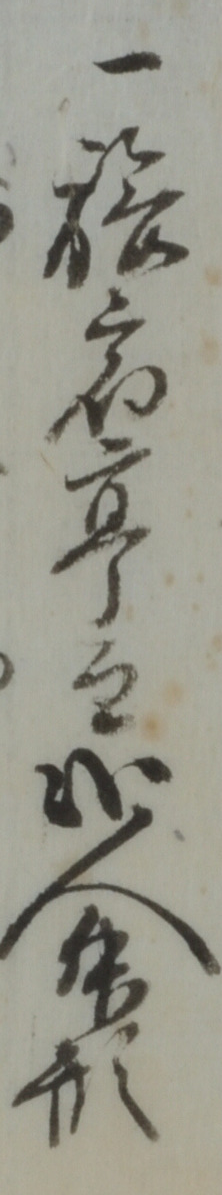一旅宿亭主弐人升形
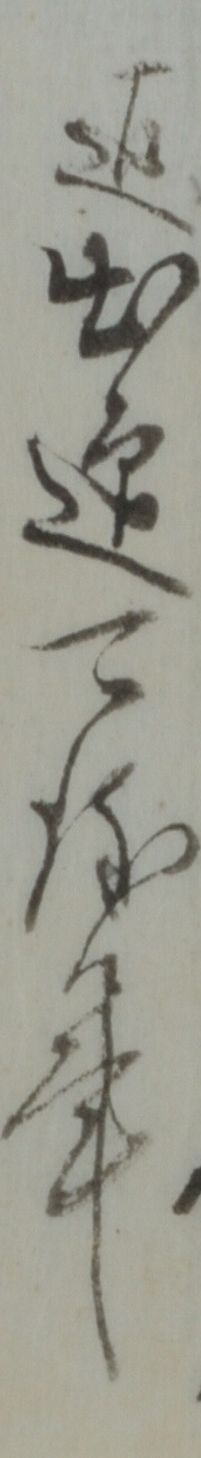迄出迎可致候事
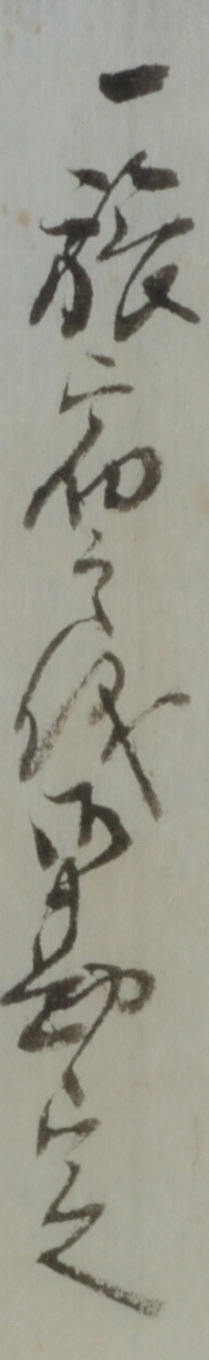一旅宿之儀御勘定
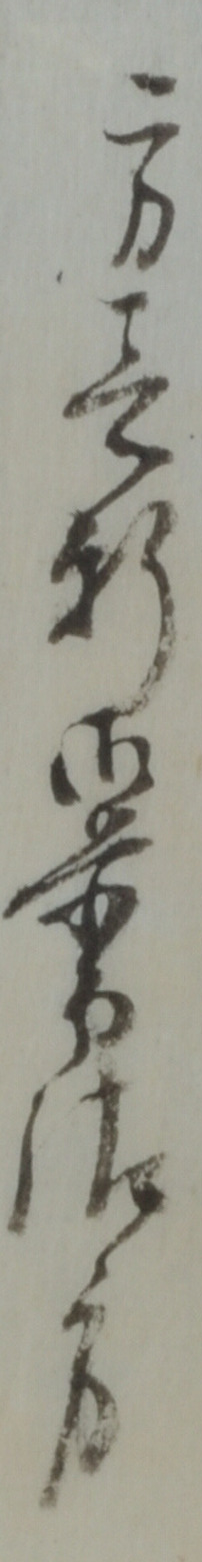方壱軒御普請方
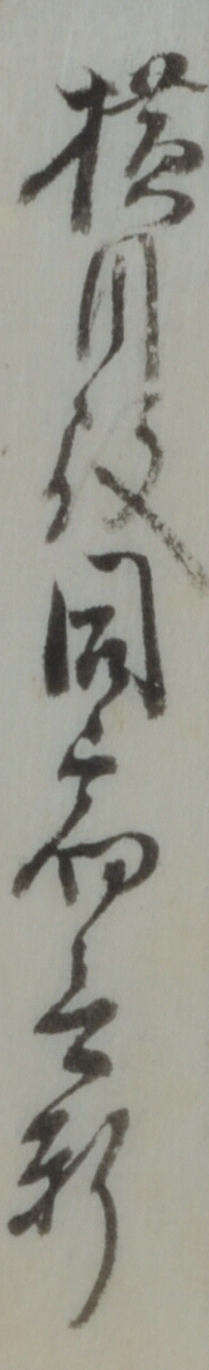横目役同宿壱軒
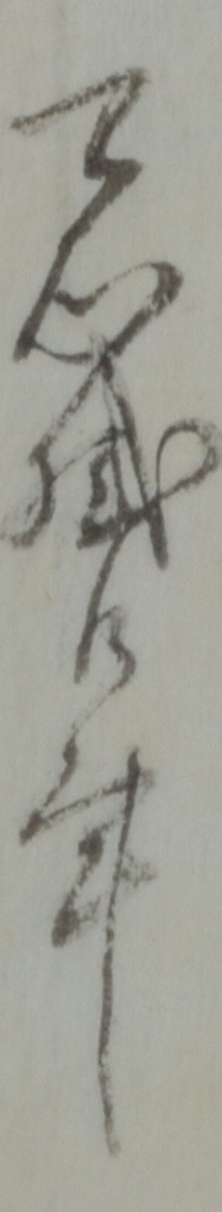可心掛候事

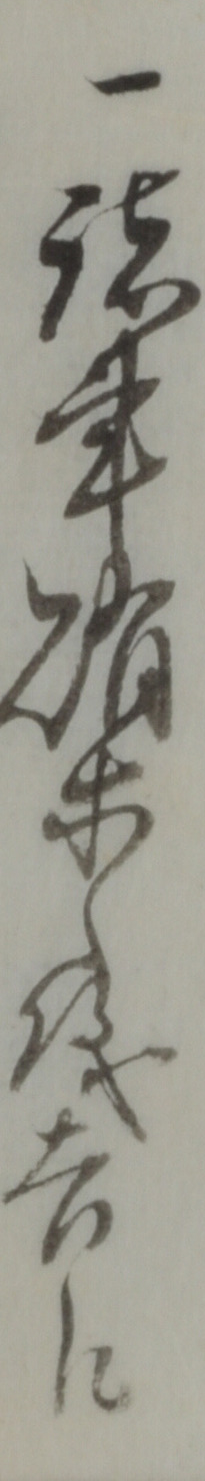一諸事賄等之儀去ル
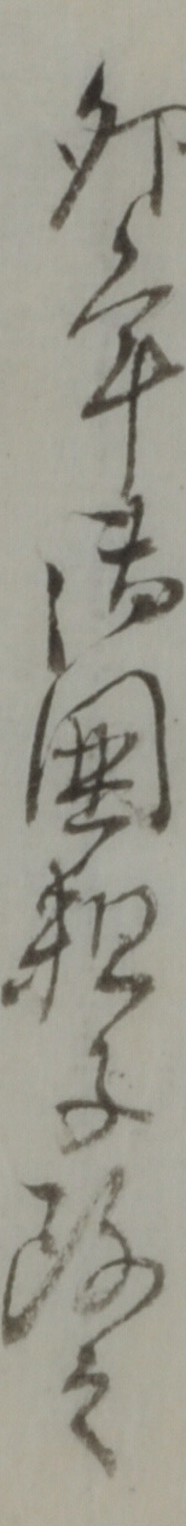卯年御囲籾子改之
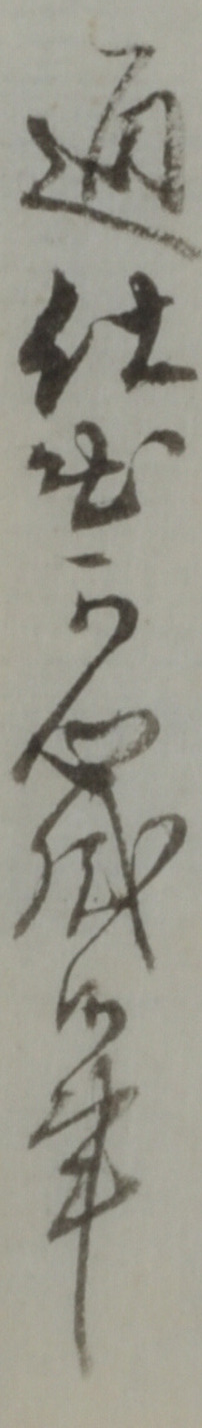通仕出可心掛候事
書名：御勘定御普請役江戸御役人様諸事控
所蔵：伊那市立高遠町図書館・合同会社AMANE
